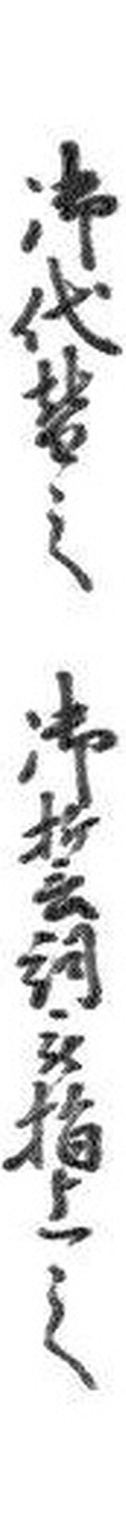御代替之御誓詞被指上之
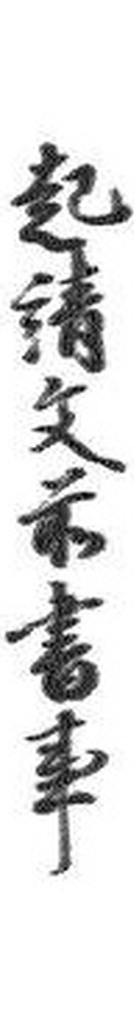起請文前書事
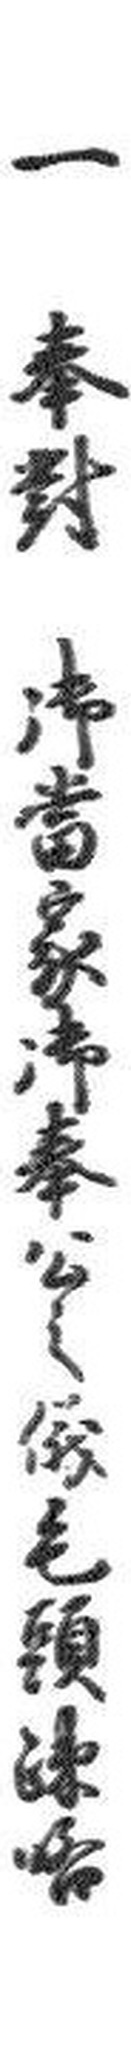一奉対御当家御奉公之儀毛頭疎略

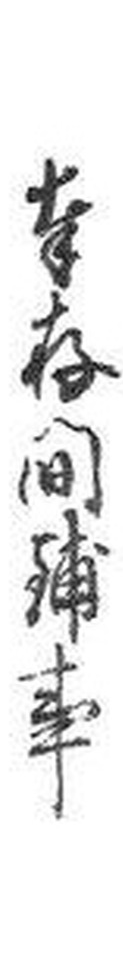奉存間鋪事
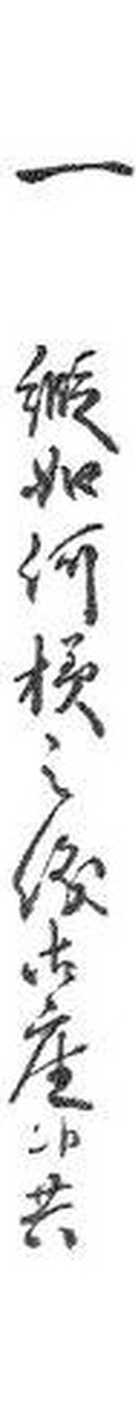一縦如何様之儀御座候共
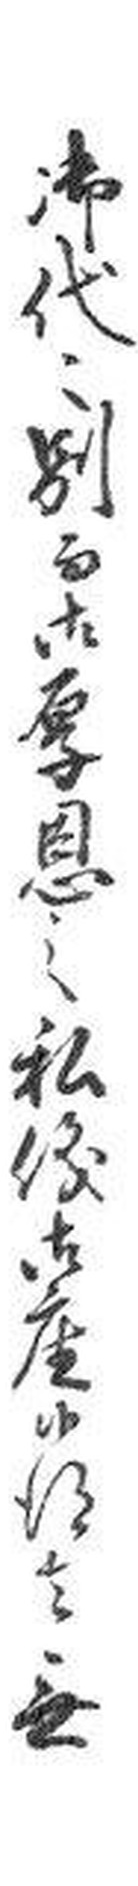御代々別而御厚恩之私儀御座候得者無
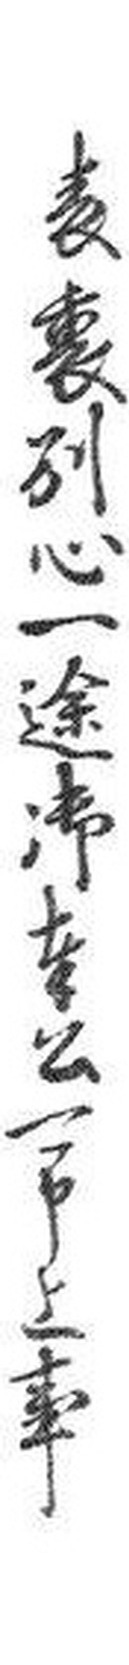表裏別心一途御奉公可申上事
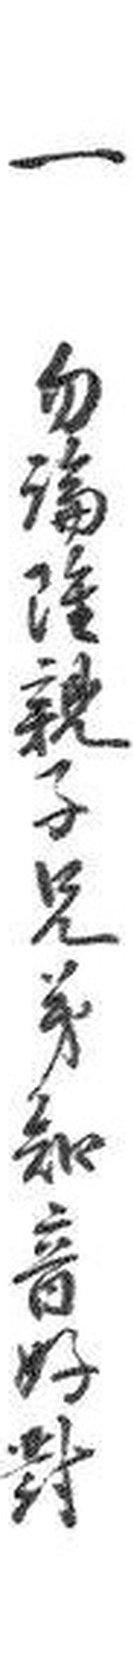一勿論雖親子兄弟知音好対
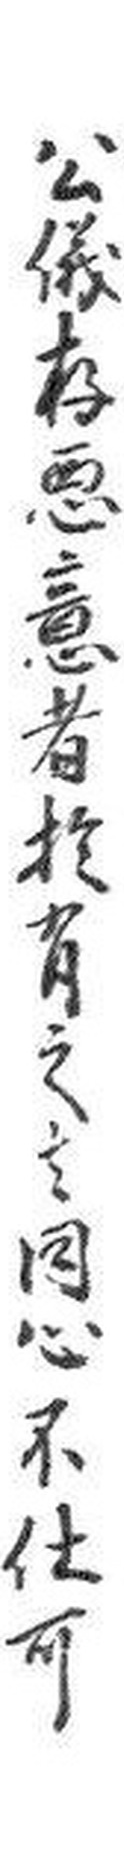公儀存悪意者於有之者同心不仕可
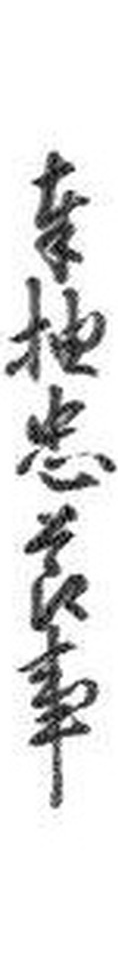奉抽忠節事
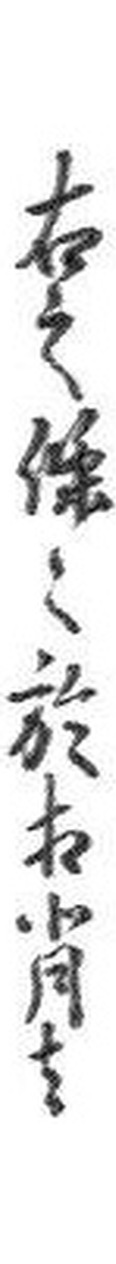右之条々於相背者
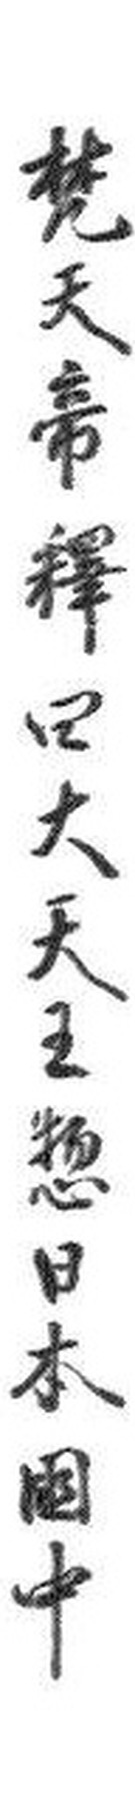梵天帝釈四大天王惣日本国中
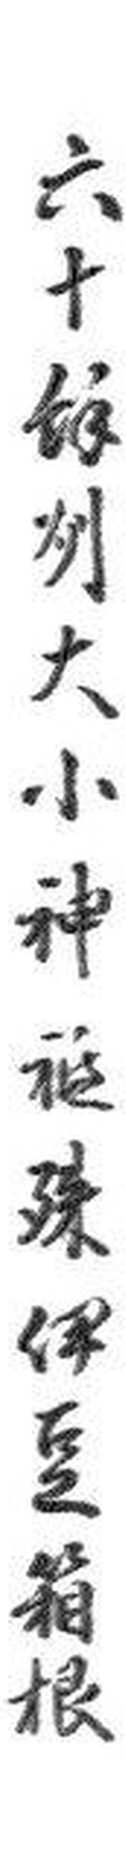六十余州大小神祇殊伊豆箱根
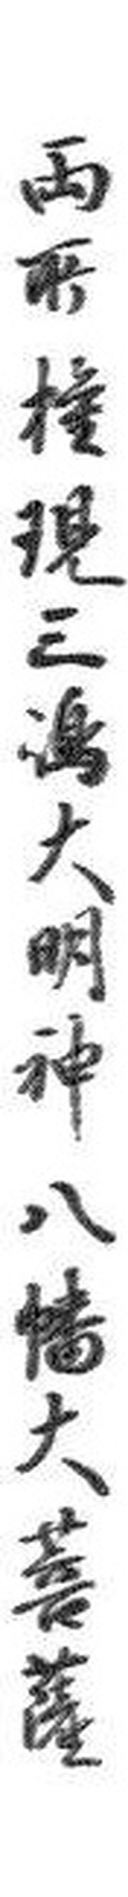両所権現三島大明神八幡大菩薩
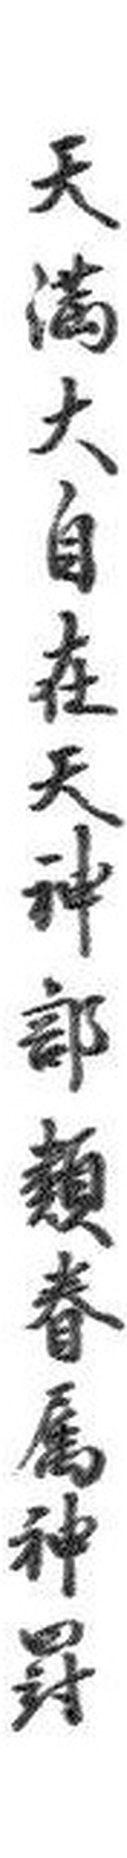天満大自在天神部類眷属神罰
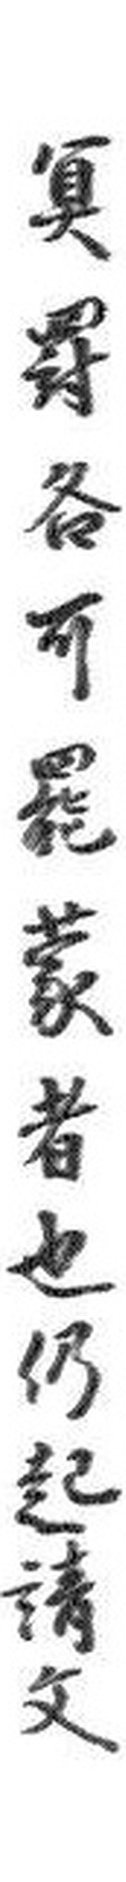冥罰各可罷蒙者也仍起請文
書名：家譜 二十五 吉品公 従宝永六年到同七年
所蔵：福井県文書館 Fukui Prefectural Archives
